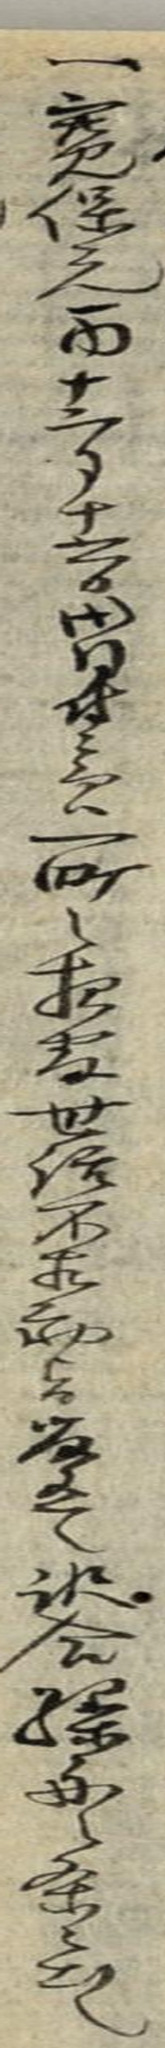一寛保元酉十二月十六日御目付に而は一町之夜番世話不相勤候旨留有之訳合繰舟之条に出之
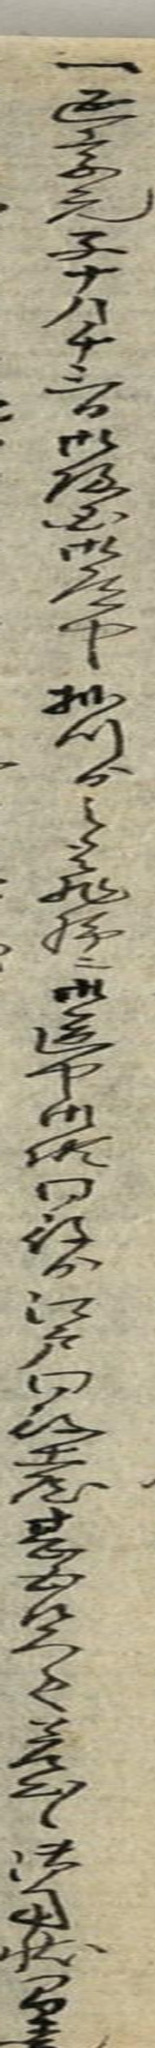一延享元子十月十三日御帰国御道中掛川ゟ之御飛脚に御道中御供同役ゟ江戸同役土屋甚五左衛門方へ差出候御用状間違
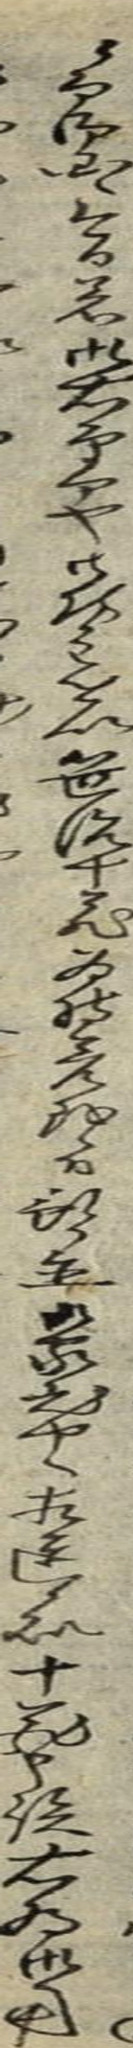に而御国へ今日着御右筆部屋御坊主を以笹治十蔵為持差越候付預り置御家老中へ相達候処十蔵申談右為御用
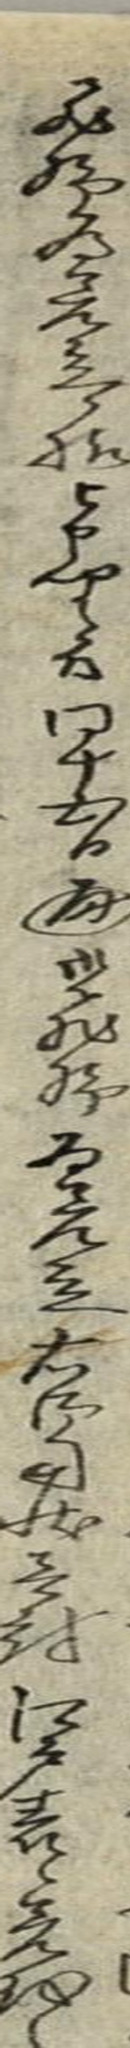飛脚為差立候様被申聞候に付同十五日通御飛脚為差立右御用状壱封江戸表へ差越之
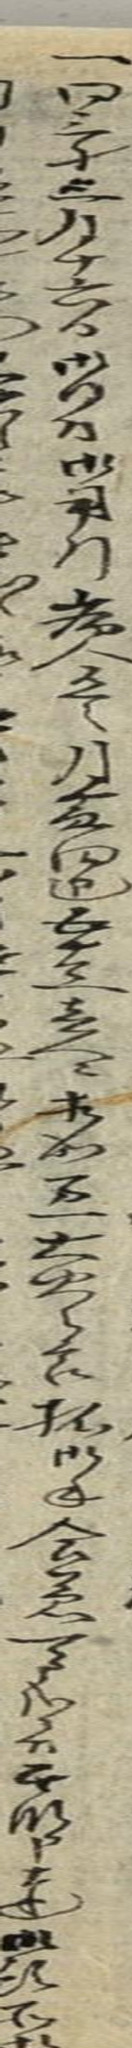一同三寅三月十六日御目付御用引病人有之月番田辺五太夫壱人に相成万一大火之節抔御手合兼可被成候に付其段申達御預所御
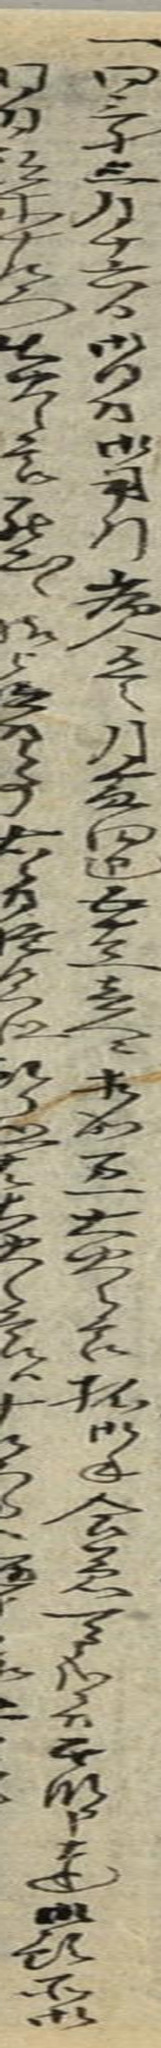一同三寅三月十六日御目付御用引病人有之月番田辺五太夫壱人に相成万一大火之節抔御手合兼可被成候に付其段申達御預所御
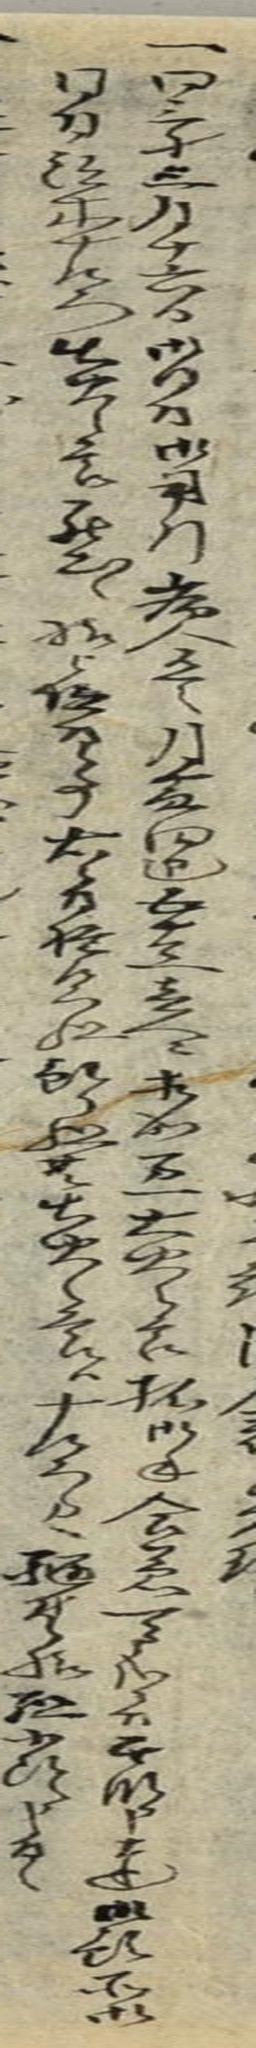目付鈴木十左衛門出火之節罷出候様被仰付候事右に付権左衛門組預り組共出火之節は十左衛門方へ駆付候様組小頭へ申付候
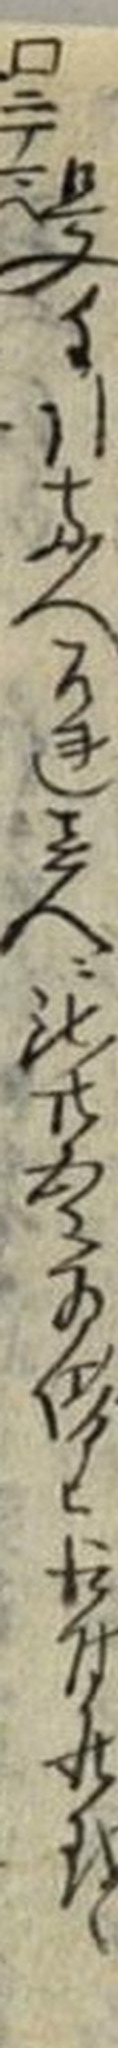且又手引両人召連壱人に銀廿五匁拝借被仰付罷越候
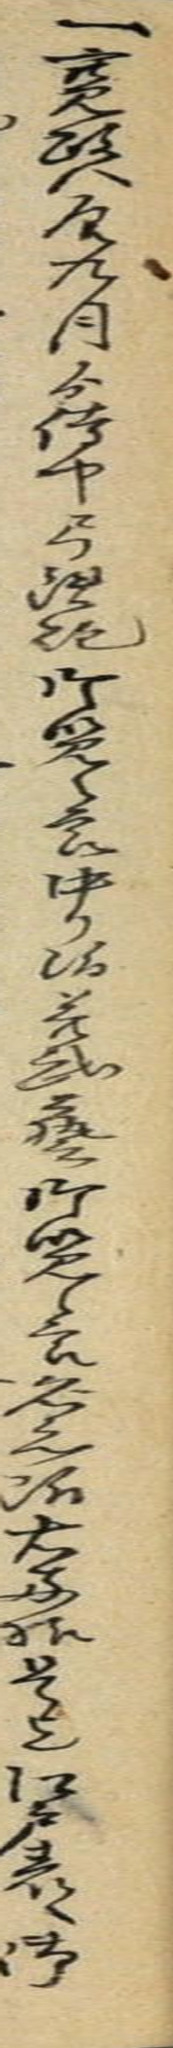一寛政八辰九月ゟ侍中弓鉄砲御覧之節中り附并武芸御覧之節名元附右両様是迄江戸表へ御
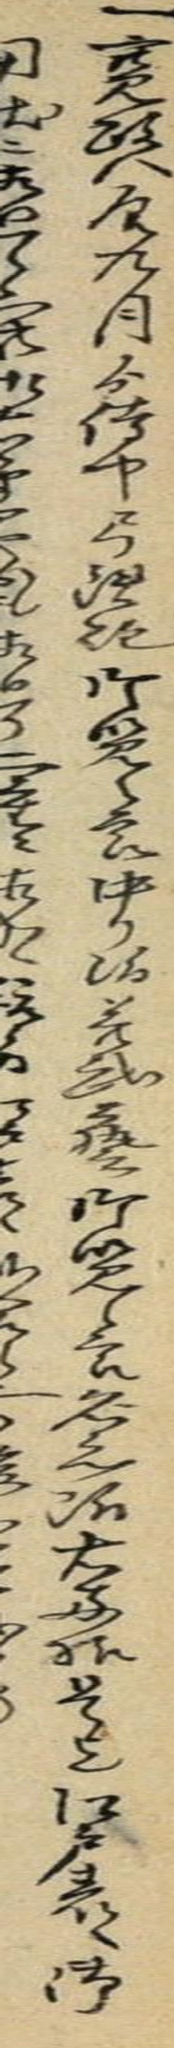一寛政八辰九月ゟ侍中弓鉄砲御覧之節中り附并武芸御覧之節名元附右両様是迄江戸表へ御
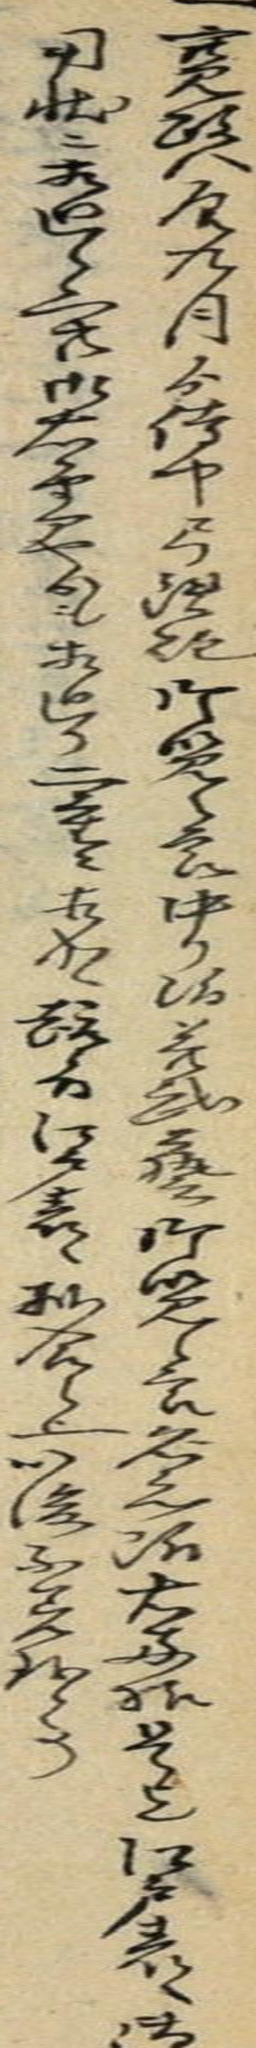用状に相廻り候へ共御右筆部屋ゟも相廻り二重に相成候趣に付江戸表へ掛合之上以後不差越候事
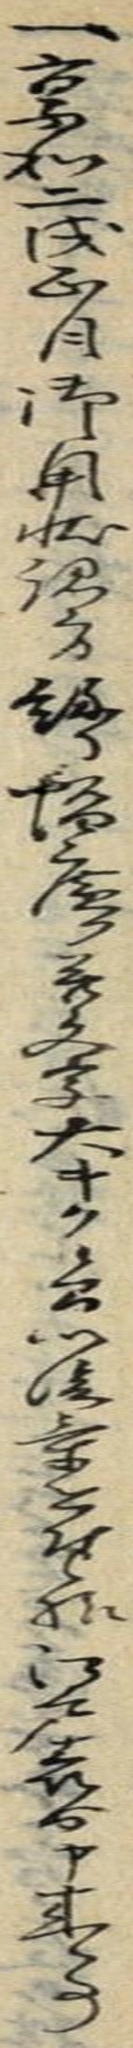一享和二戌正月御用状認方餘り幅広く并文字大きく候間以後気を付候様江戸表ゟ申来候事
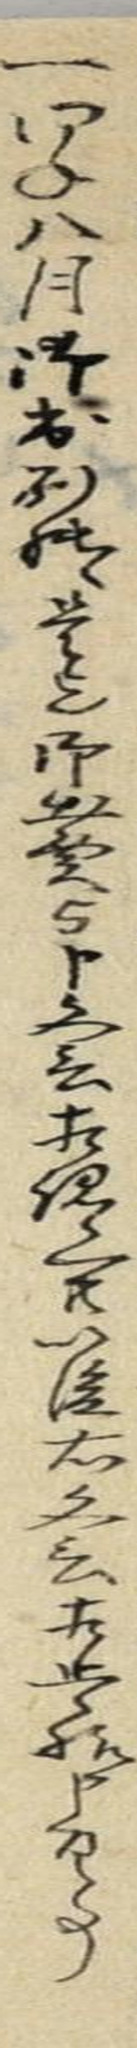一同年八月御出別紙へ是迄御出殿と申文言相認候へ共以後右文言相止候様申付候事
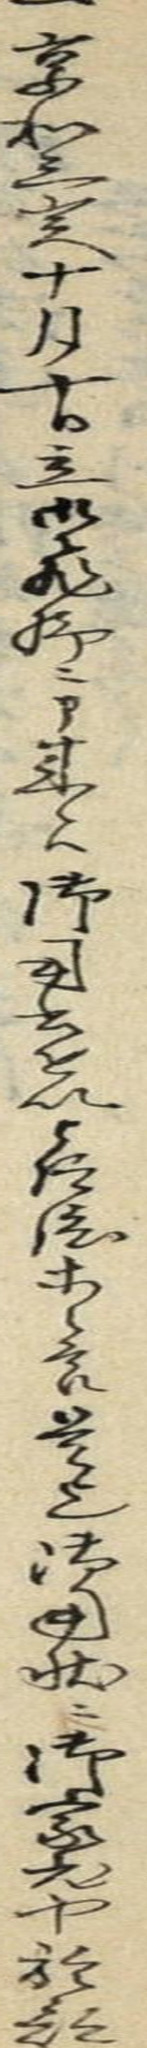一享和三亥十月十日立御飛脚に申来候は御用書を以被仰渡等之節是迄御用状に御家老中於部
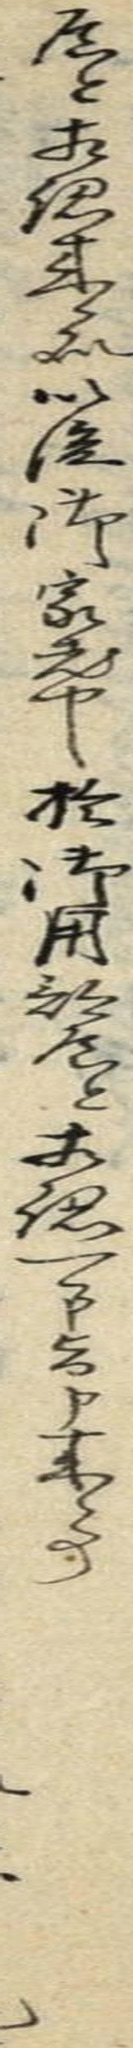屋と相認来候処以後御家老中於御用部屋と相認可申旨申来候事
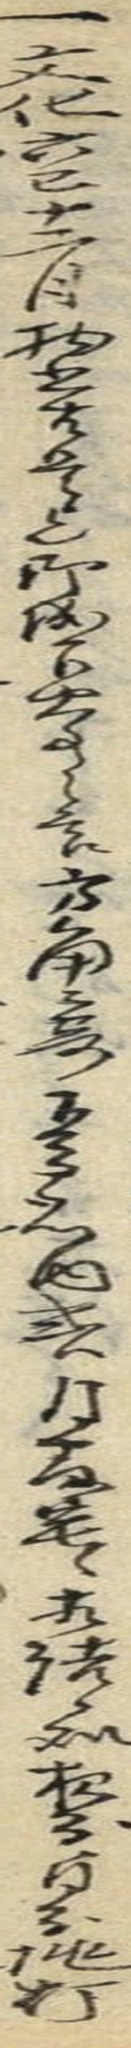一文化六巳十二月物書共是迄御城下火事之節方角に寄下馬御門内或は月番宅へ相詰候処夜分自分挑灯
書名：蒐輯之部
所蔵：福井県文書館 Fukui Prefectural Archives
